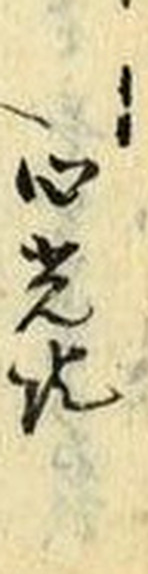心光院
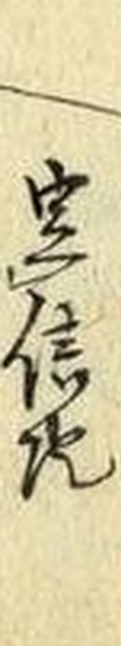定信院
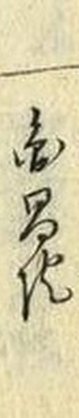円昌院

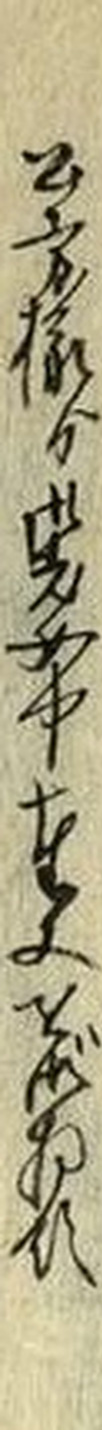公方様ゟ御老女中奉文を以御拝領
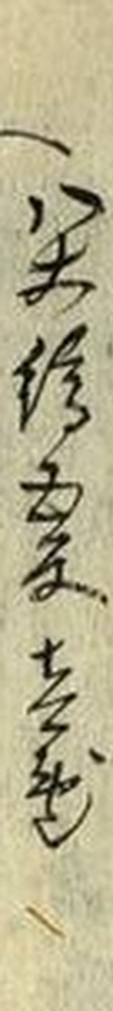八丈縞五反壱台
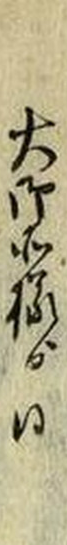大御所様ゟ同
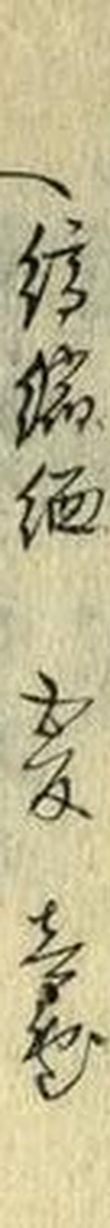縞縮緬五反壱台
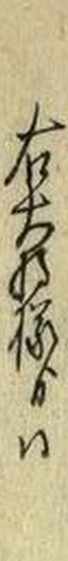右大将様ゟ同
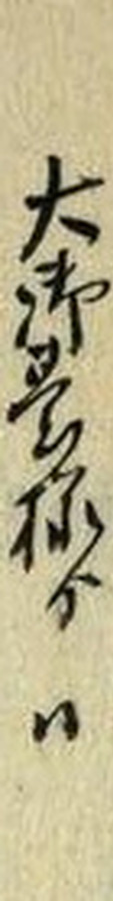大御台様ゟ同
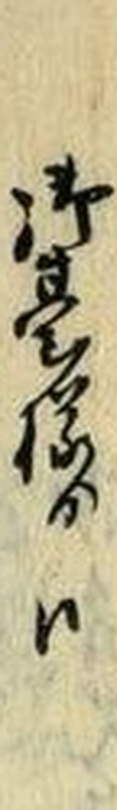御台様ゟ同
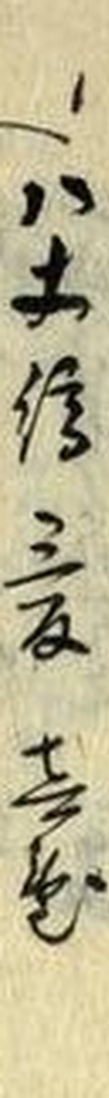八丈縞三反壱台
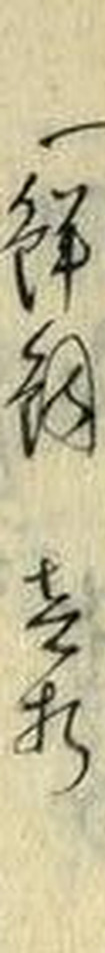鮮鯛壱折
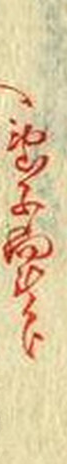台子向被下

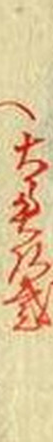大奥頂戴
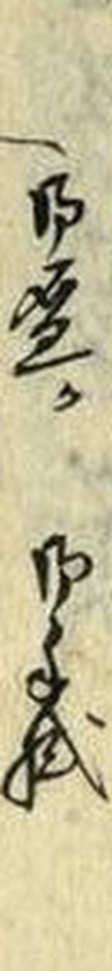御盃御手拭
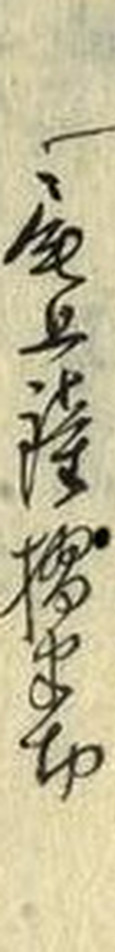尾上鐘摺半切
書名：少傅日録抄（斉善付側向頭取日記、江戸并道中、初入在国、逝去後…
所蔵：福井県文書館 Fukui Prefectural Archives
